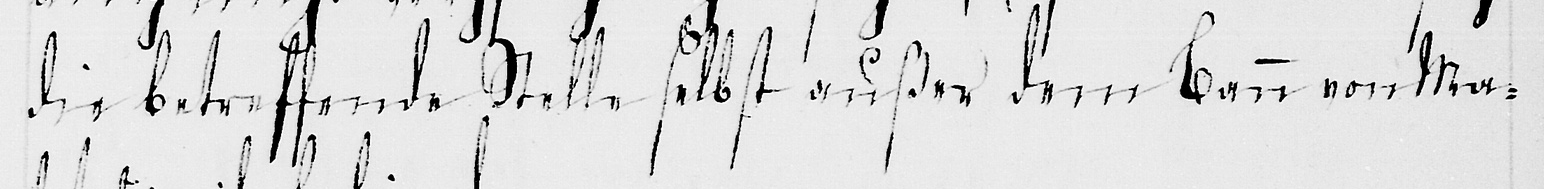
die betreffende Stelle selbst außer dem Bann von Ma¬
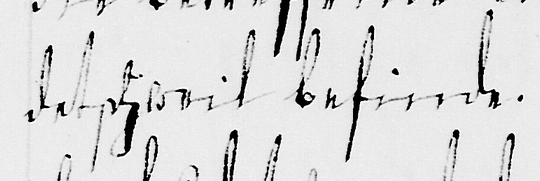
detschweil befinde.
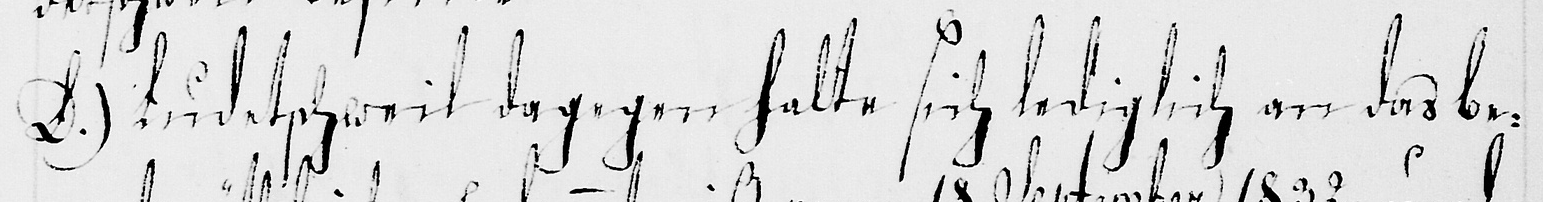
D.) Ludetschweil dagegen halte sich lediglich an das b¬
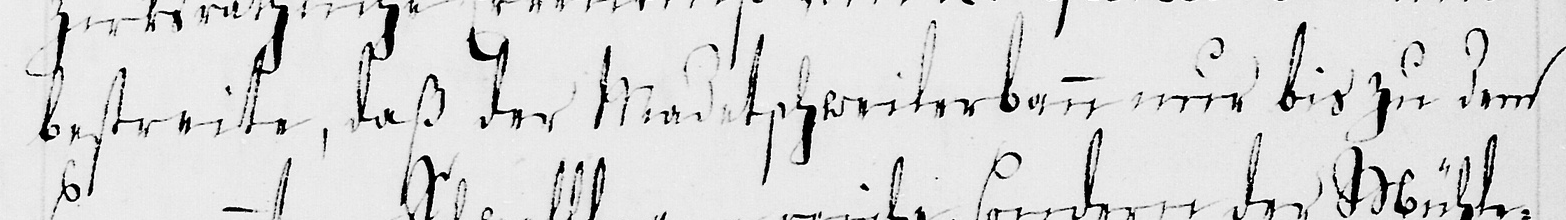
bestreite, daß der Madetschweilerbann nur bis zu dem
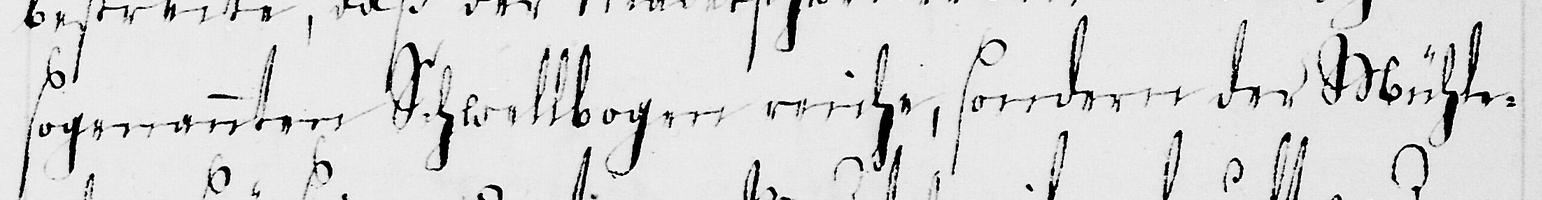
sogenannten Schwellbogen reiche, sondern der Mühle¬
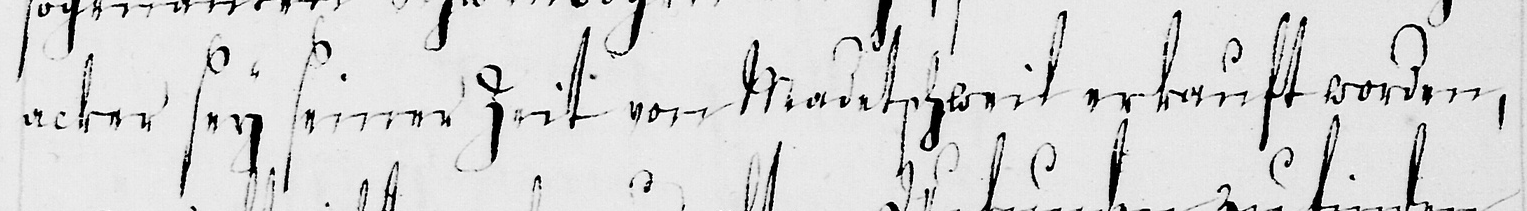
acker sey seiner Zeit von Madetschweil erkauft worden,
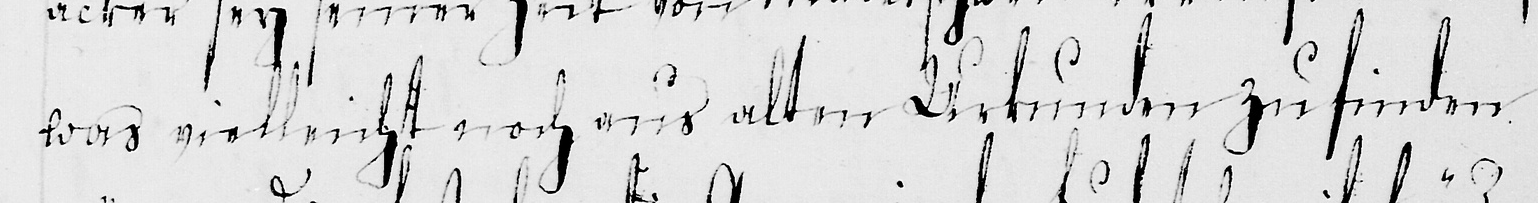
was vielleicht noch aus alten Urkunden zu finden
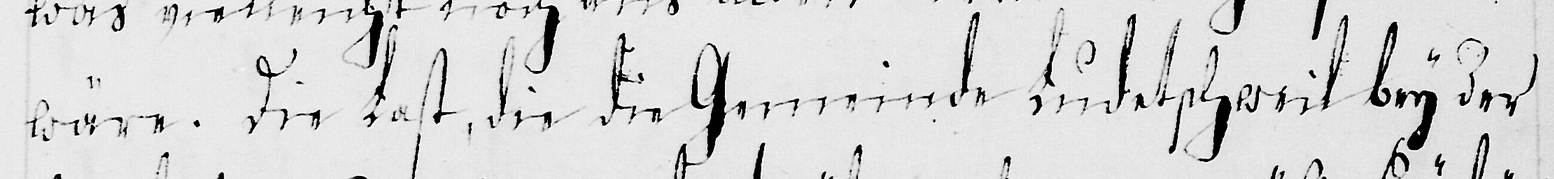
wäre. Die Last, die die Gemeinde Ludetschweil bey der
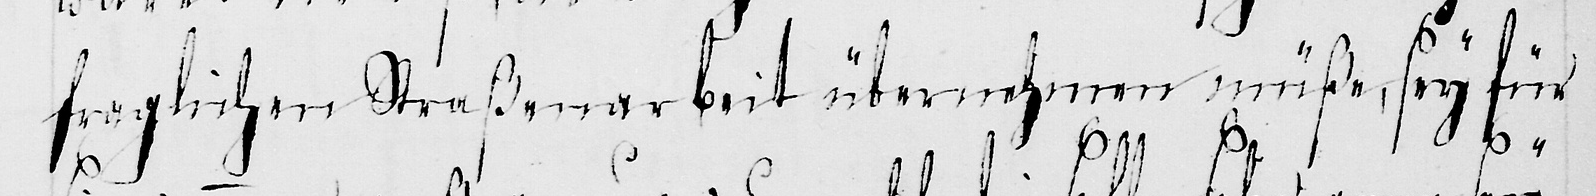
fraglichen Straßenarbeit übernehmen müße, sey für
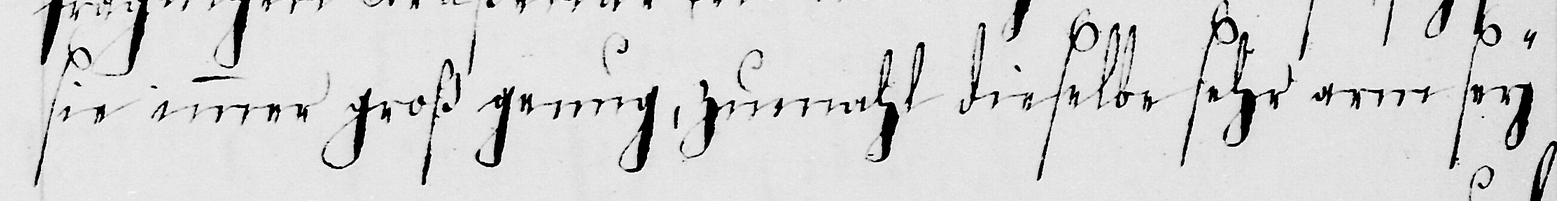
sie immer groß genug, zumahl dieselbe sehr arm sey
